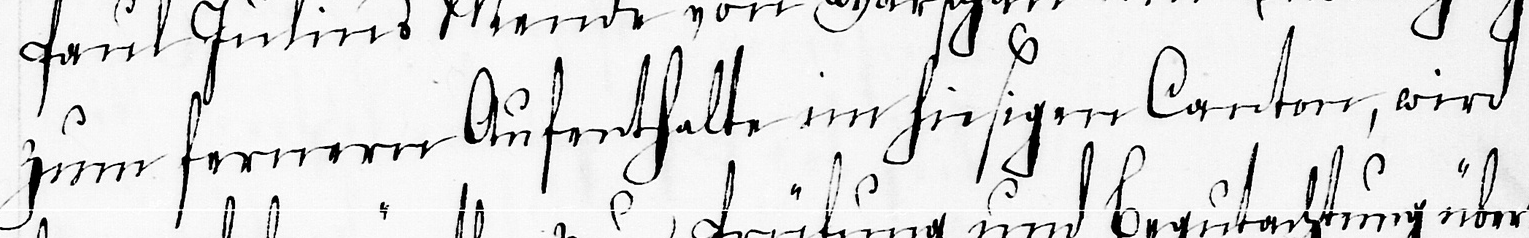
zum fernern Aufenthalte im hiesigen Canton, wird
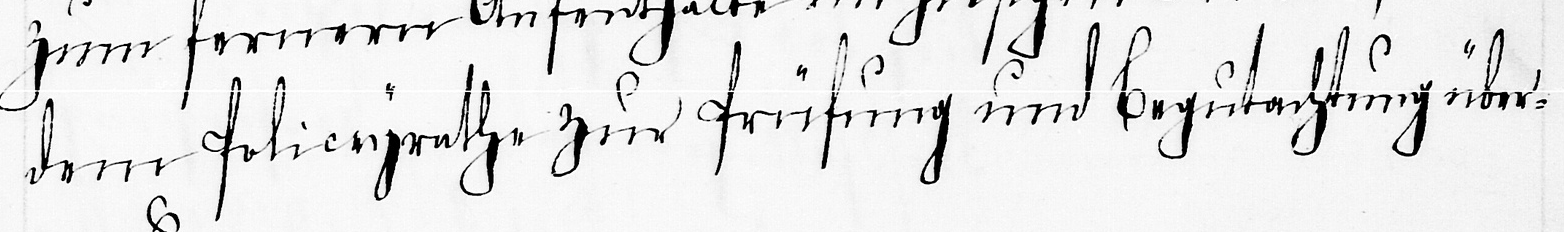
dem Policeyrathe zur Prüfung und Begutachtung über¬
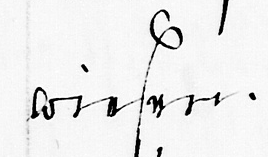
wiesen.
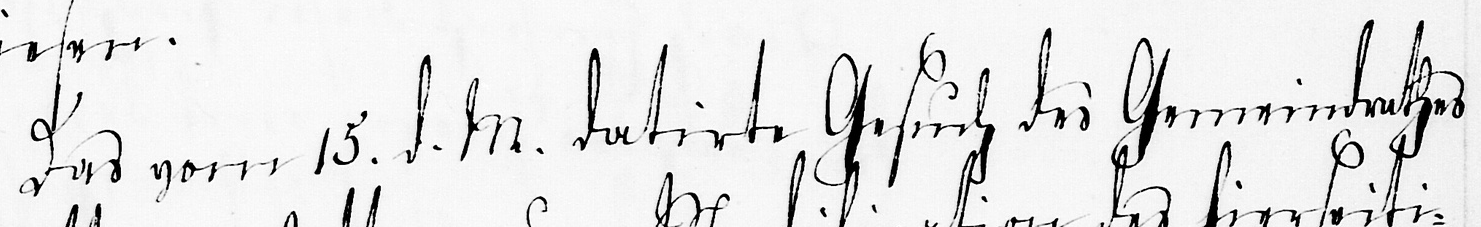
Das vom 15. d. M. datirte Gesuch des Gemeindrath¬
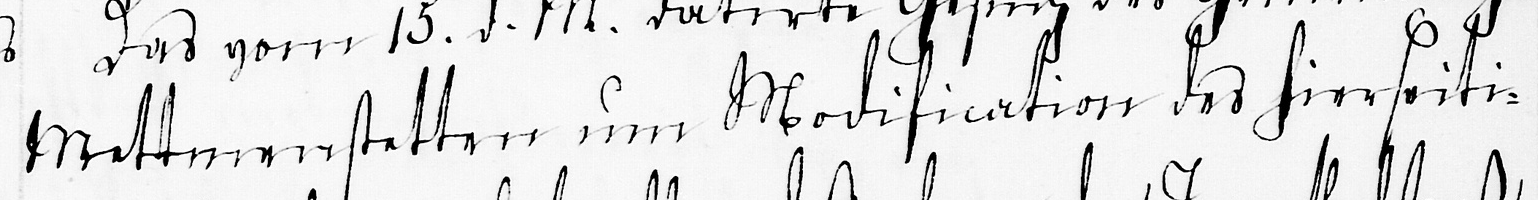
Mettmenstetten um Modification des hierseiti¬
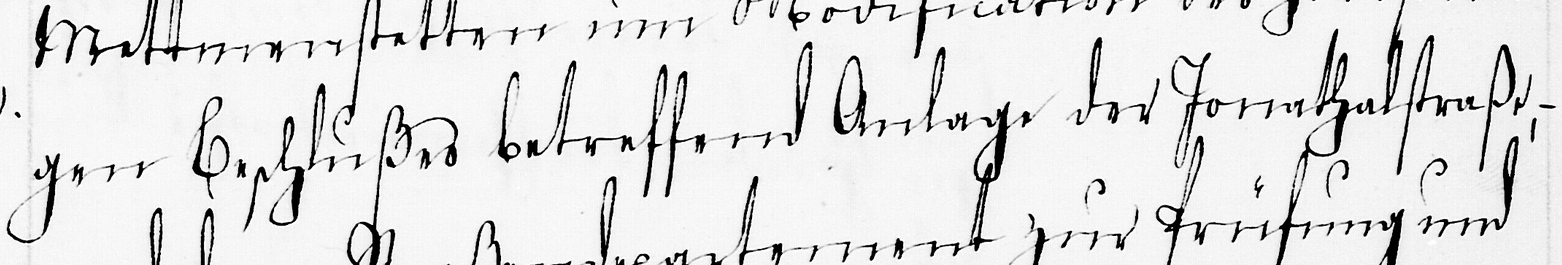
gen Beschlußes betreffend Anlage der Jonathalstraße,
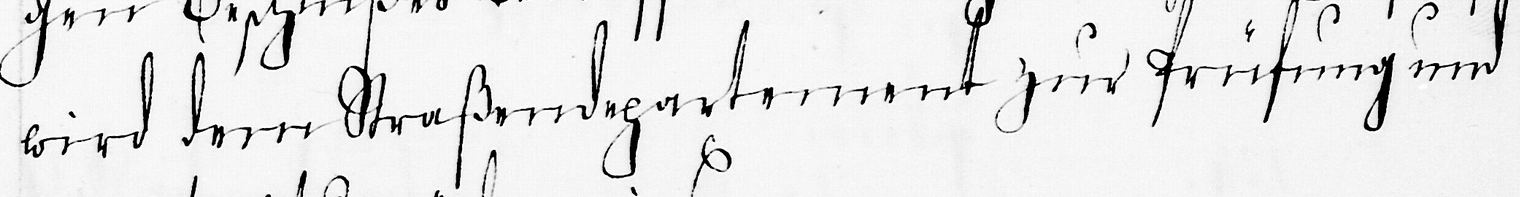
wird dem Straßendepartement zur Prüfung und
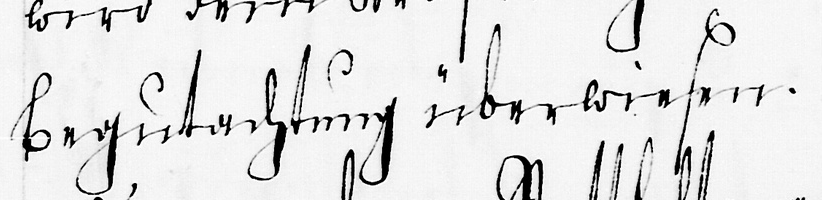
Begutachtung überwiesen.
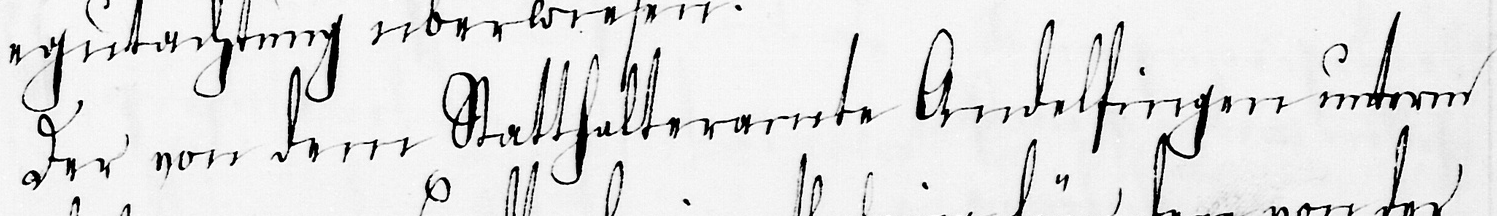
Der von dem Statthalteramte Andelfingen unterm
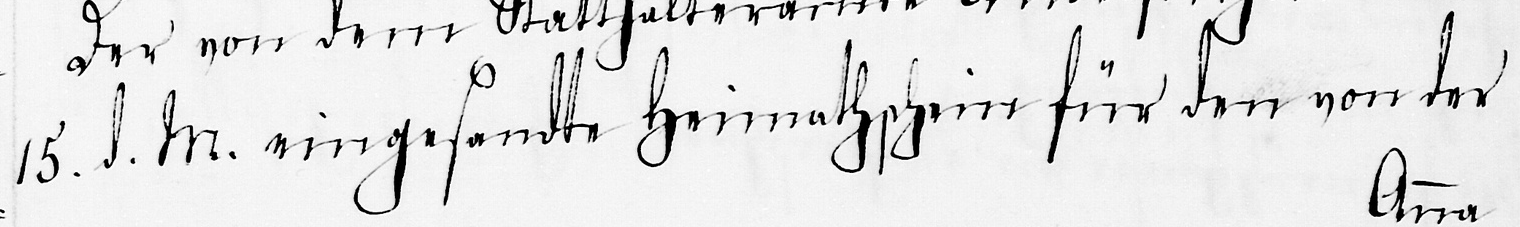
15. d. M. eingesandte Heimathschein für den von der
